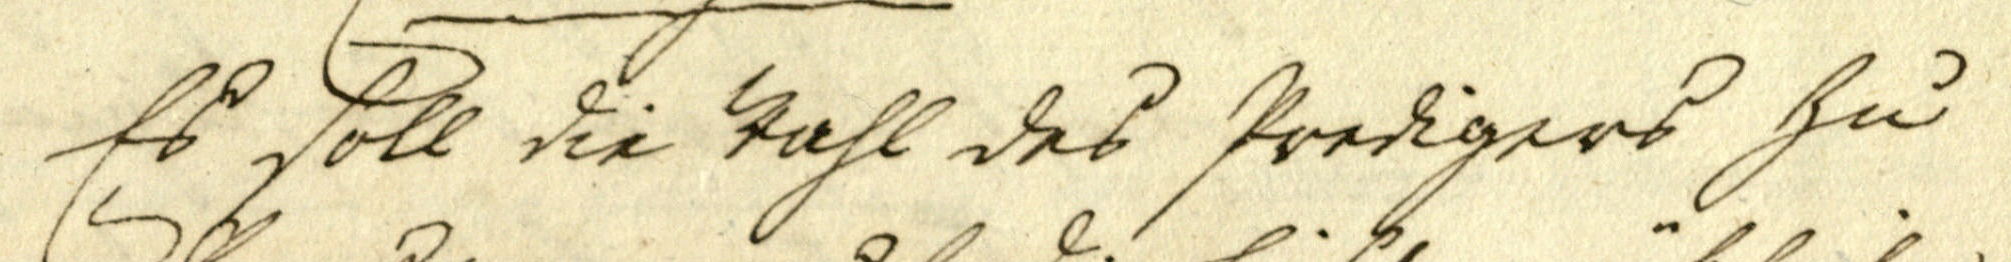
Es soll die Wahl des Predigers zu
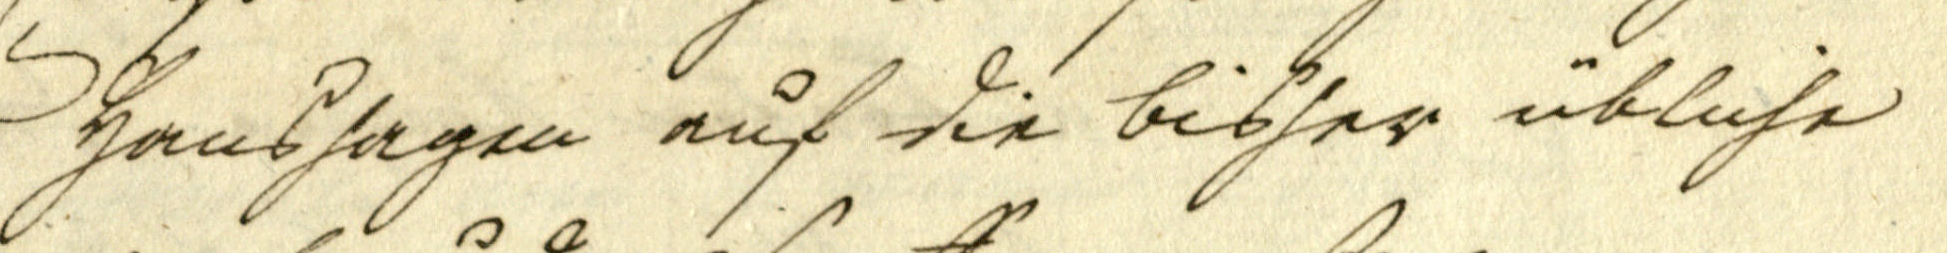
Hanshagen auf die bisher übliche
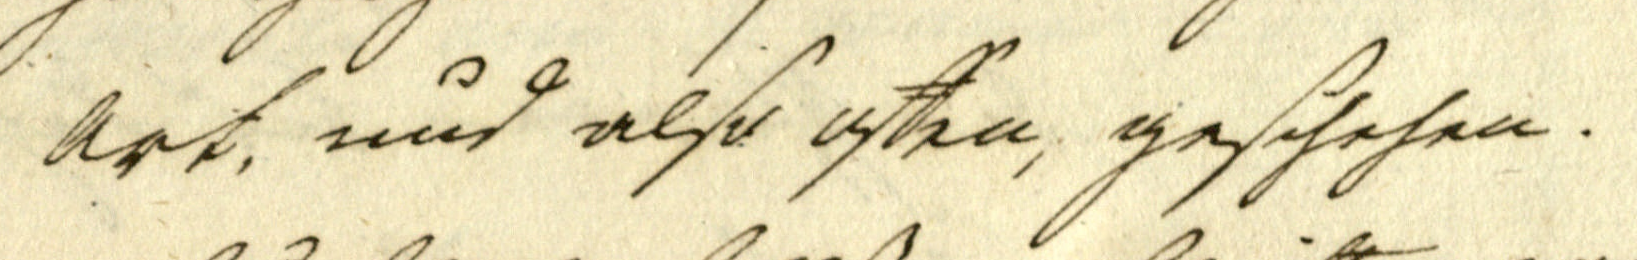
Art, und also offen, geschehen.
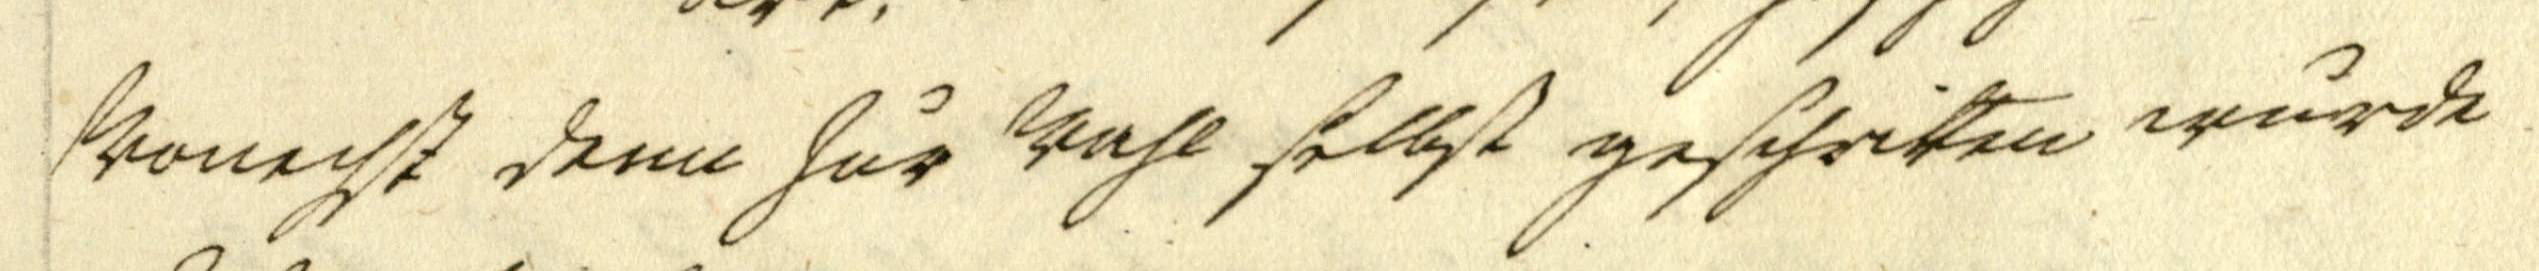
Wonechst denn zur Wahl selbst geschritten wurde
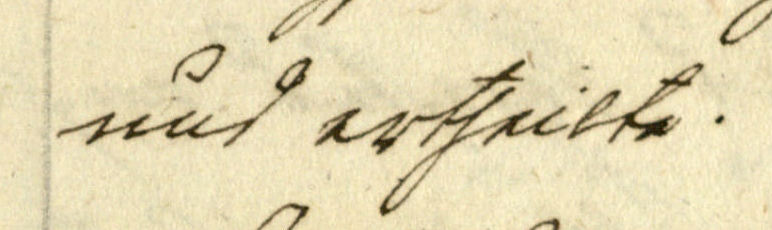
und ertheilte.
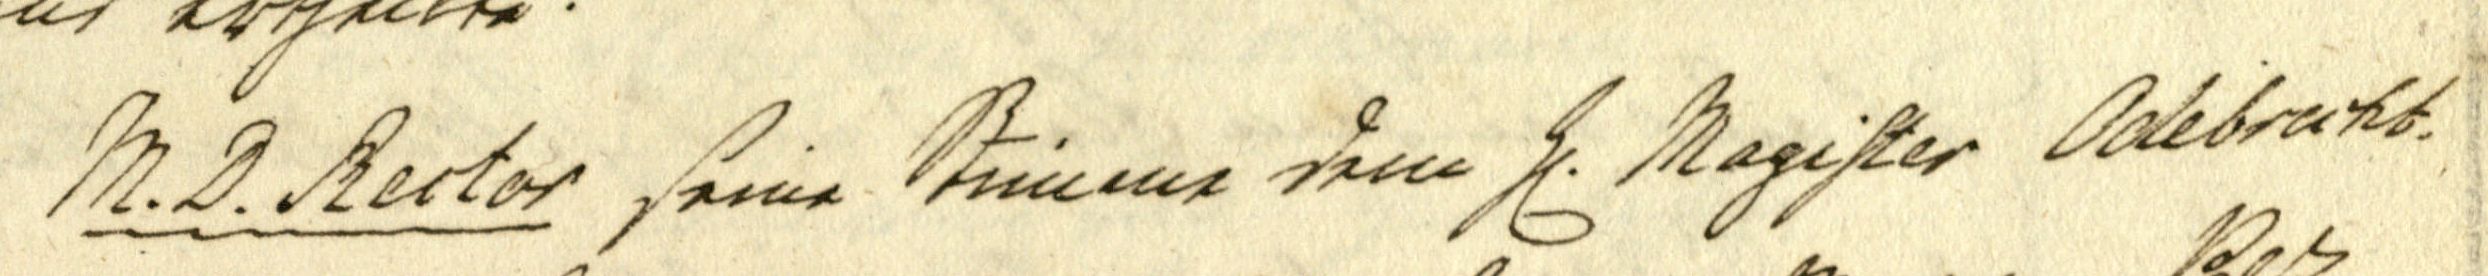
M. D. Rector sein Stimme dem H. Magister Odebrecht.
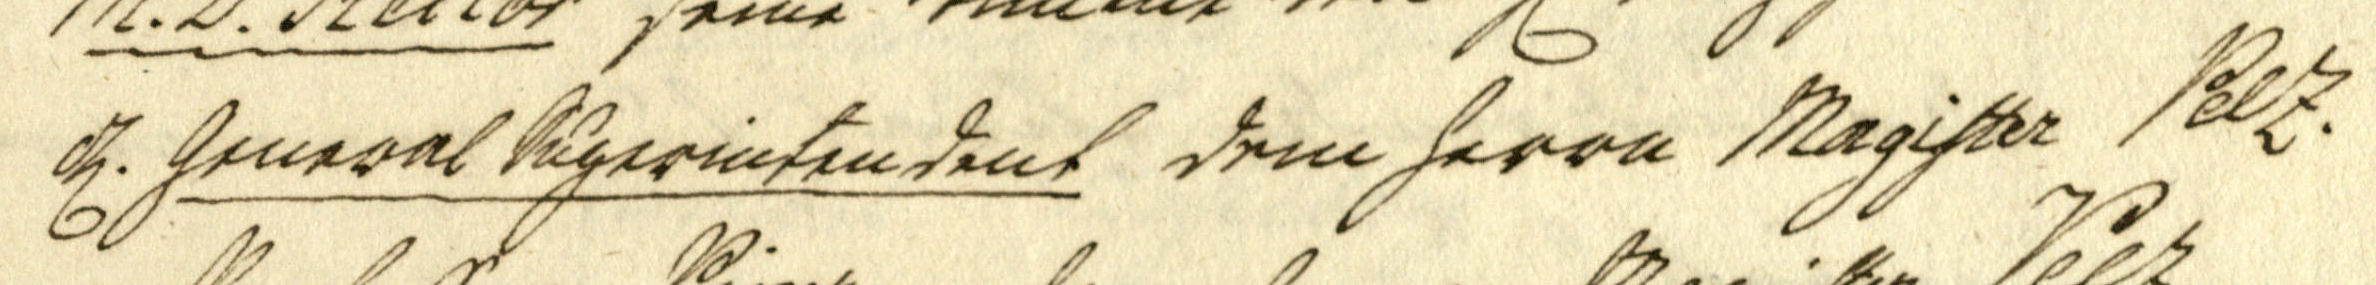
dh. General Superintendent dem Herrn Magister Pelz.
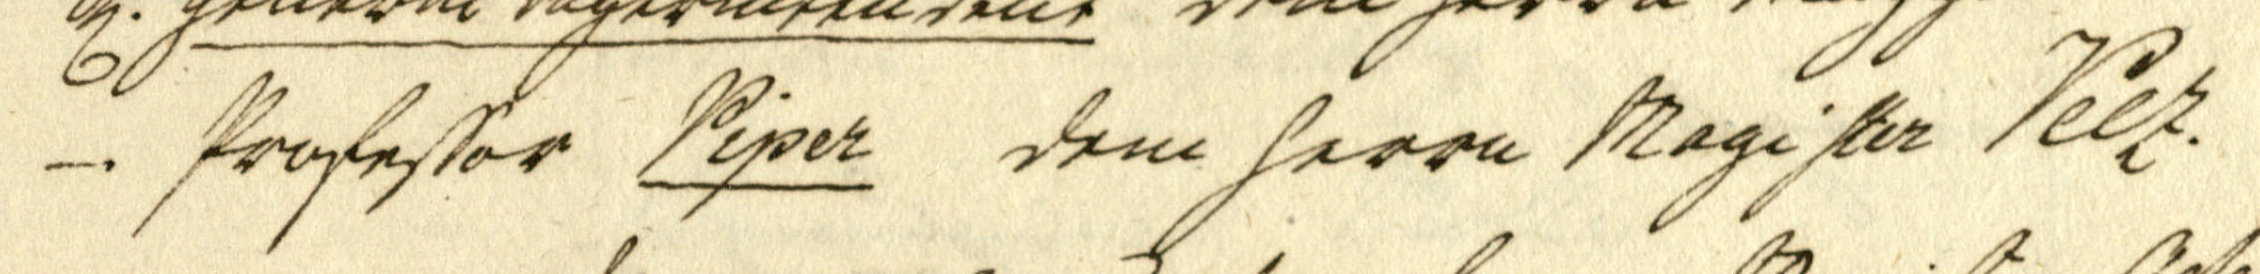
Professor Piper dem Herrn Magister Pelz.
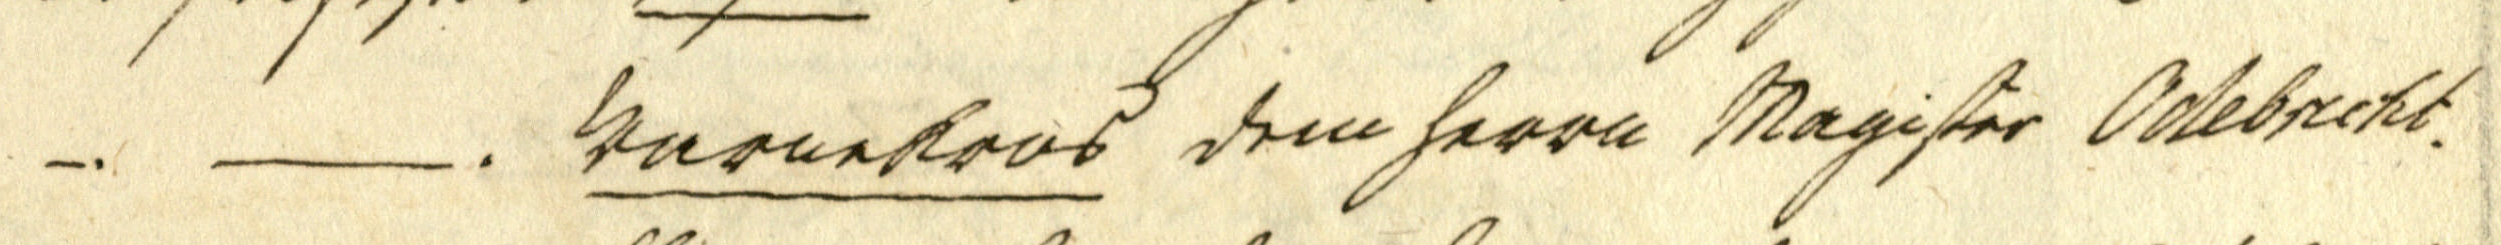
Warnekros dem Herrn Magister Odebrecht.
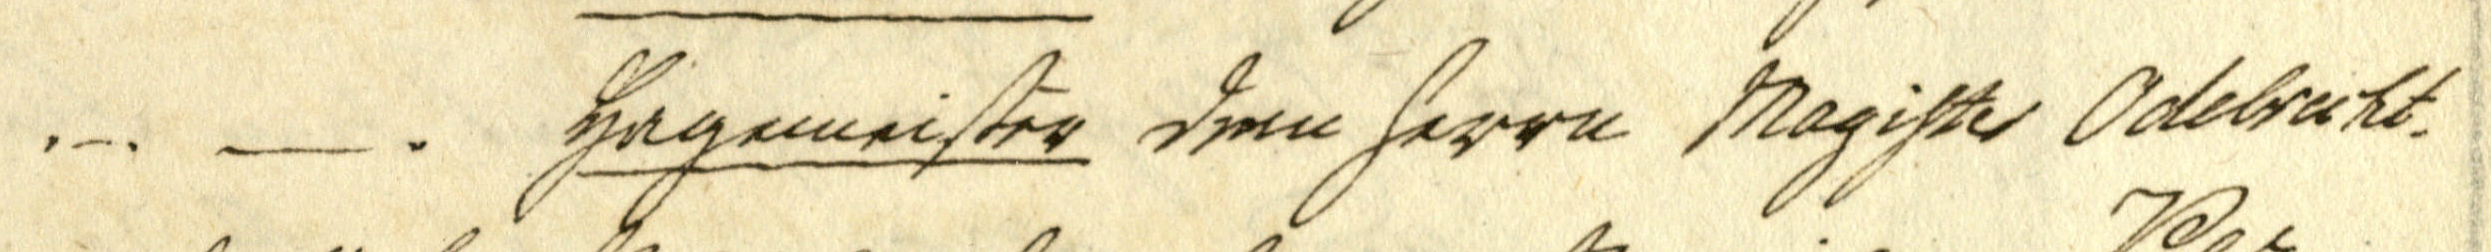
Hagemeister dem Herrn Magister Odebrecht.
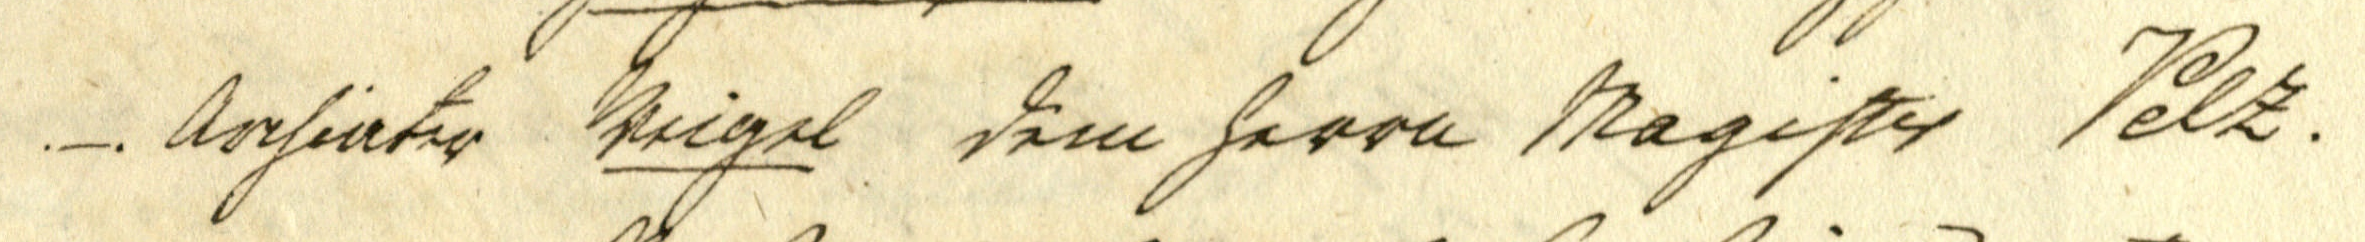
Archiater Weigel dem Herrn Magister Pelz.
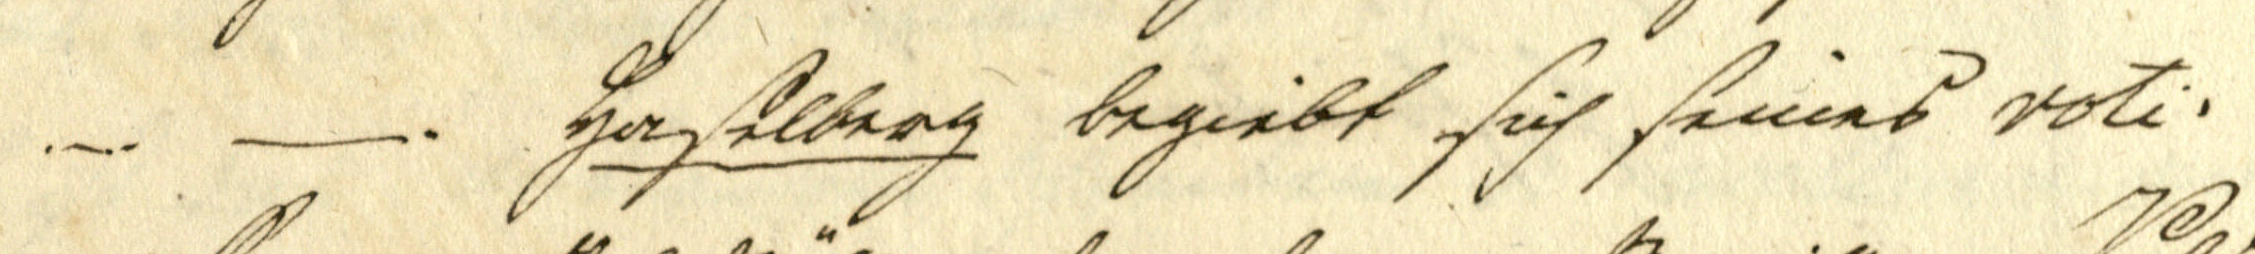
Haselberg begiebt sich seines voti.
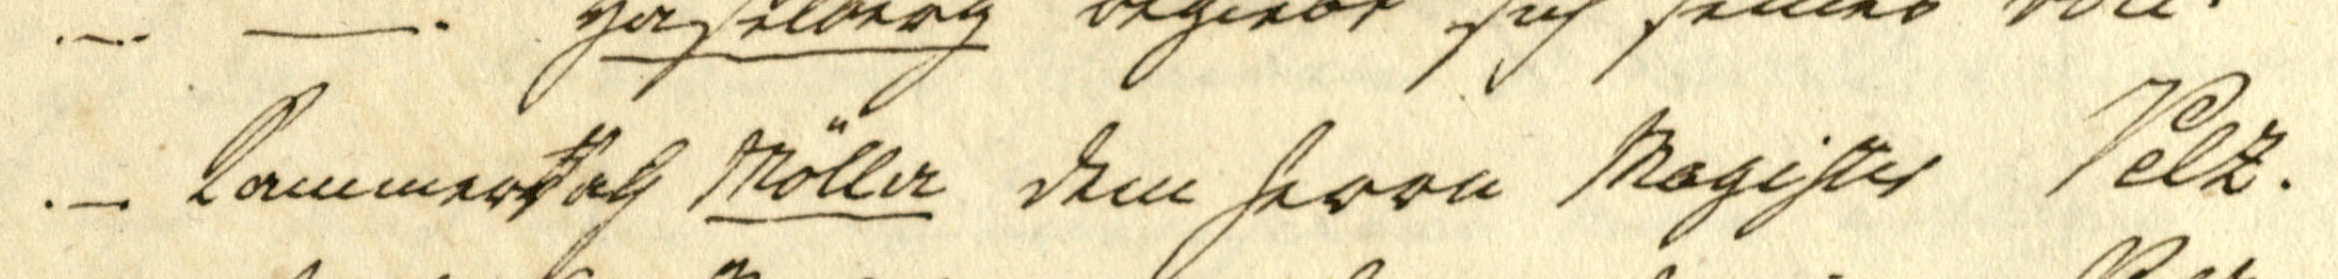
KammerRath Möller dem Herrn Magister Pelz.
